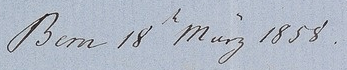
18ten März 1858.
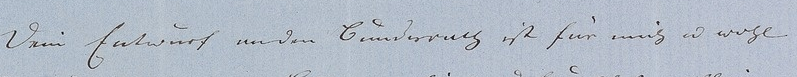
Dein Entwurf an den Bundesrath ist für mich u wohl
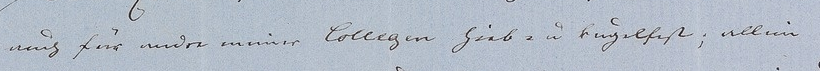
auch für andre meiner Collegen hieb- u kugelfest; allein
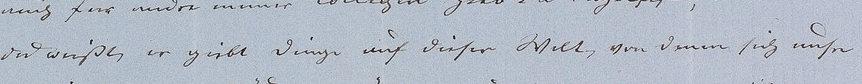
du weißt, es giebt Dinge auf dieser Welt, von denen sich unsre
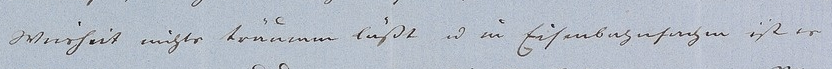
Weisheit nichts träumen läßt u in Eisenbahnsachen ist es
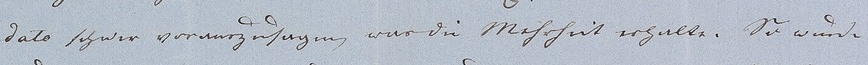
dato schwer vorauszusagen, was die Mehrheit erhalte. So wurde
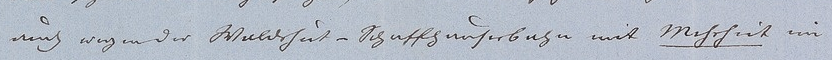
auch wegen der Waldshut–Schaffhauserbahn mit Mehrheit ein
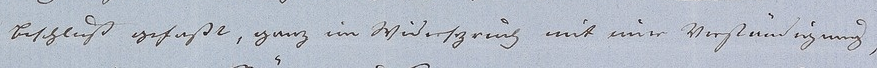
Beschluß gefaßt, ganz im Widerspruch mit einer Verständigung,
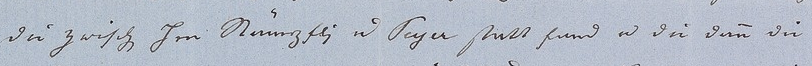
die zwischen Hrn Stämpfli u Peyer statt fand u die dann die
